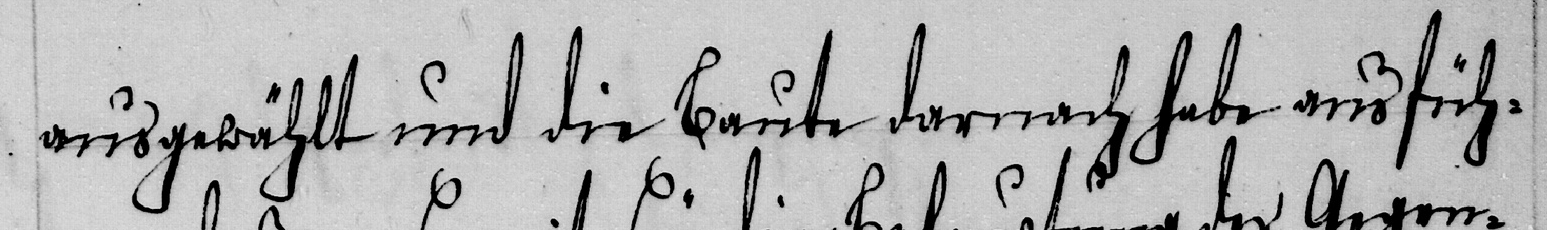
ausgewählt und die Baute darnach habe ausfüh¬
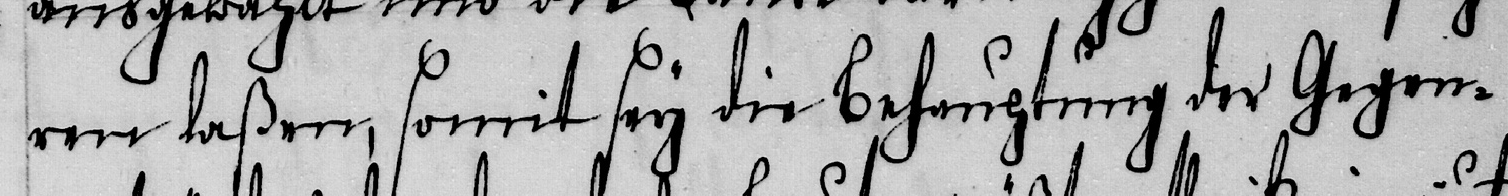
ren laßen, somit sey die Behauptung der Gegen¬
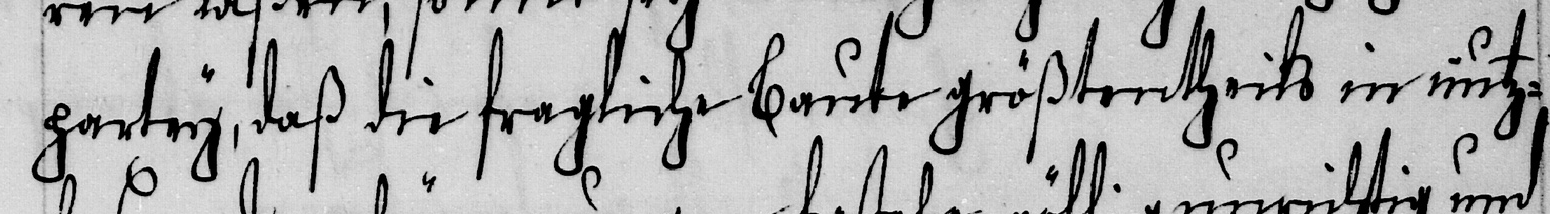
partey, daß die fragliche Baute größtentheils in nut¬
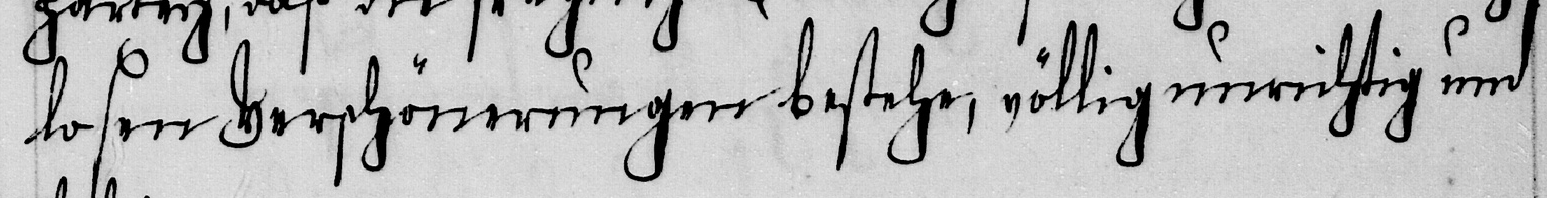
zlosen Verschönerungen bestehe, völlig unrichtig und
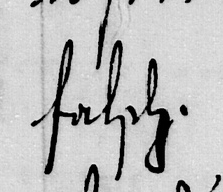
solche
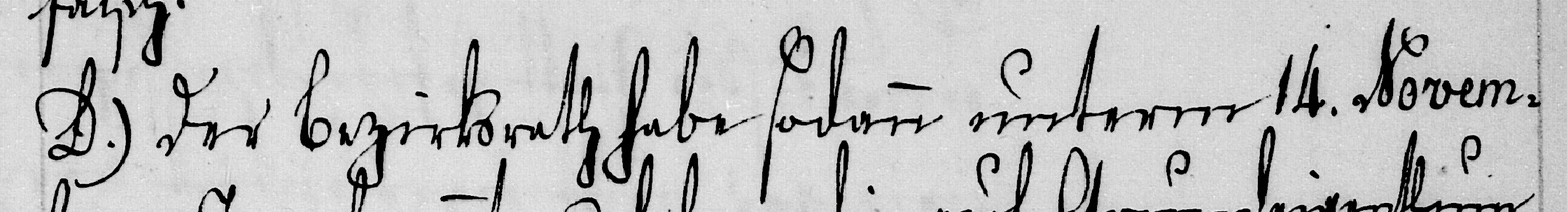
D.) Der Bezirksrath habe sodann unterm 14. Novem¬
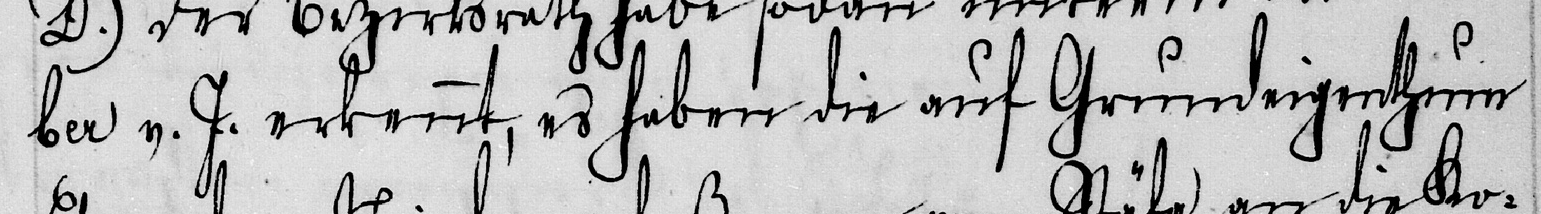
ber v. J. erkannt, es haben die auf Grundeigenthum
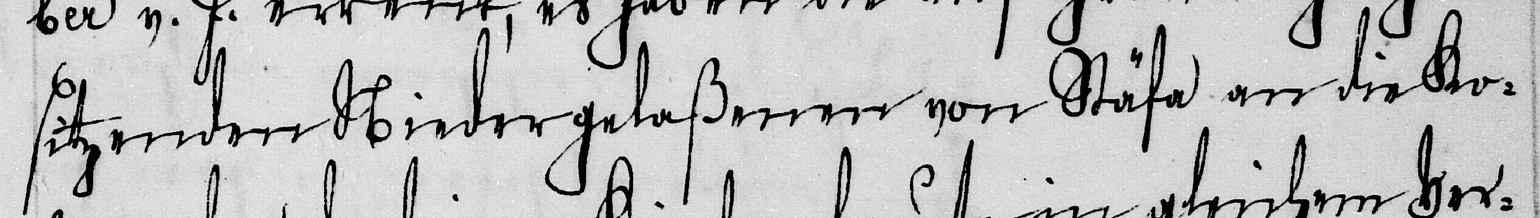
sitzenden Niedergelaßenen von Stäfa an die Ko¬
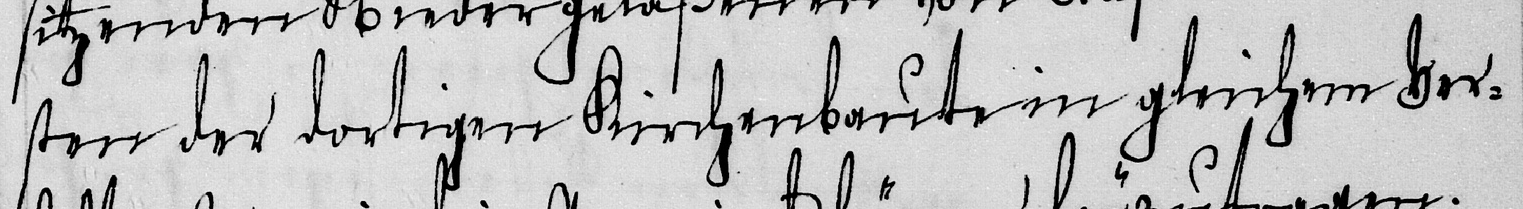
sten der dortigen Kirchenbauten in gleichem Ver¬
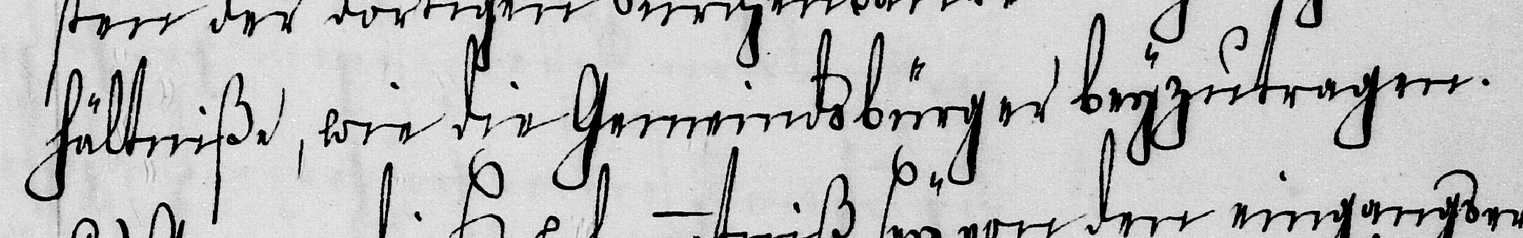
hältniße, wie die Gemeindsbürger beyzutragen.
